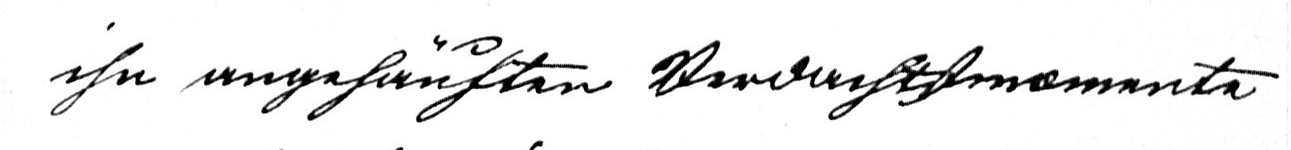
ihn angehäuften Verdachtmomente
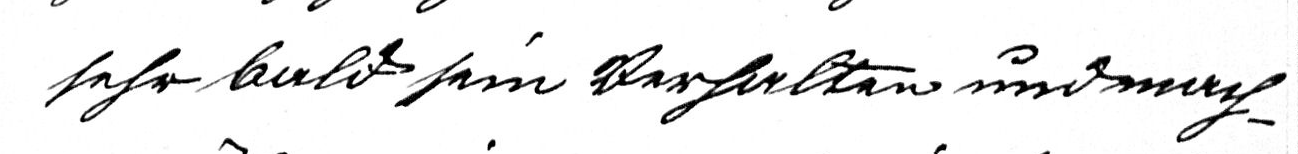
sehr bald sein Verhalten und machte
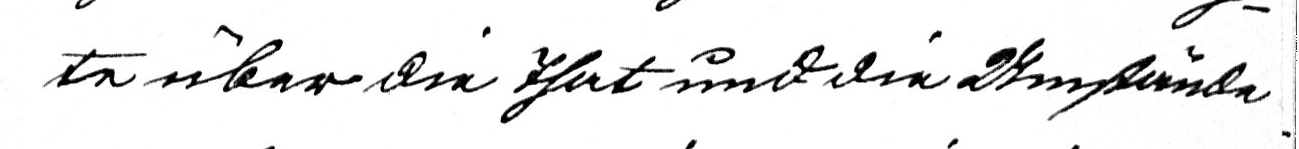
über die That und die Umstände
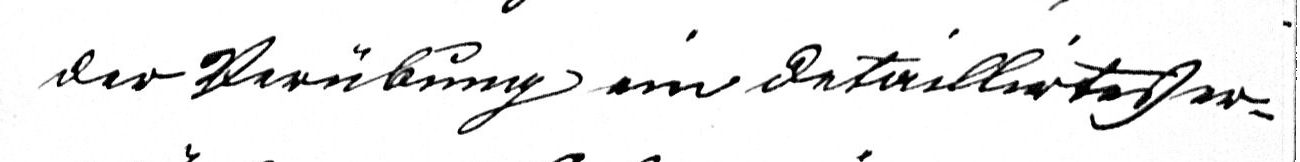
der Verübung ein detaillirteser¬
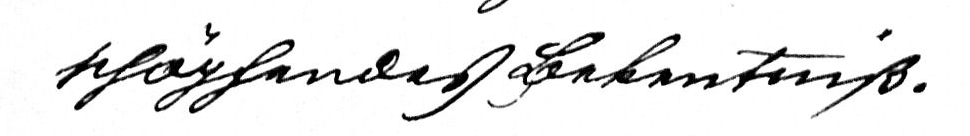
schöpfendes Bekenntniß.
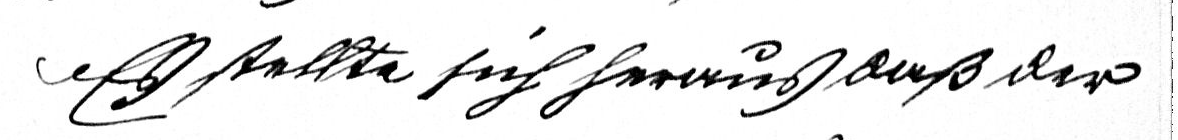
Es stellte sich heraus daß der
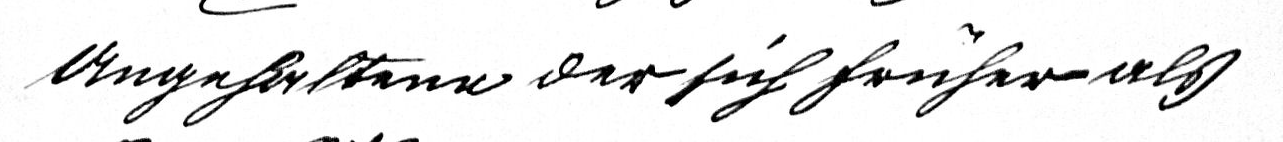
Angehaltene der sich früher als
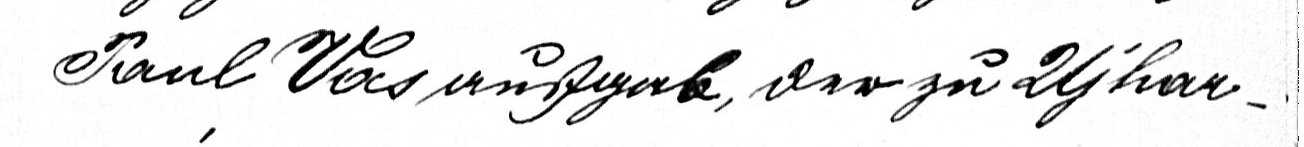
Paul Vasausgab, der zu Ujhar¬
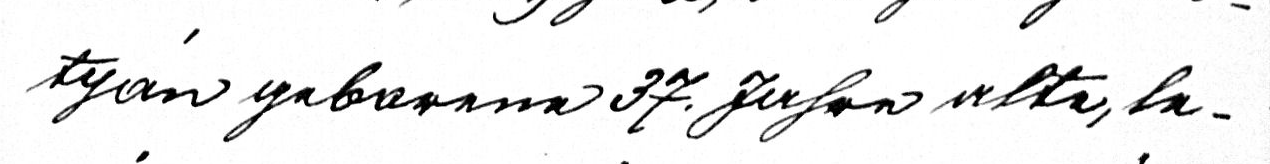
tyán geborene 37. Jahre alte, le¬
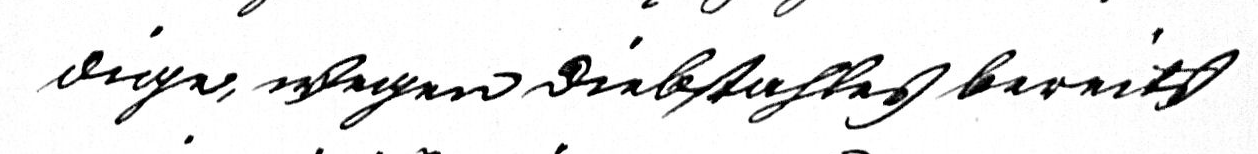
dige, wegen Diebstahles bereits
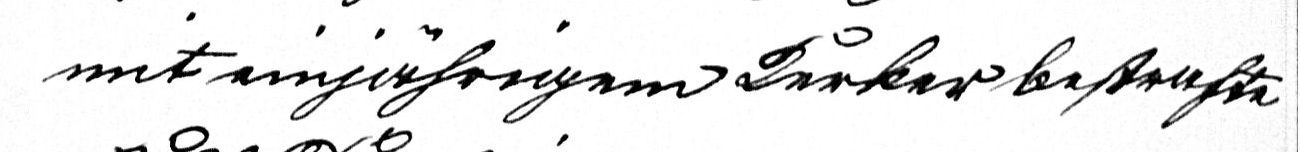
mit einjährigem Kerker bestrafte
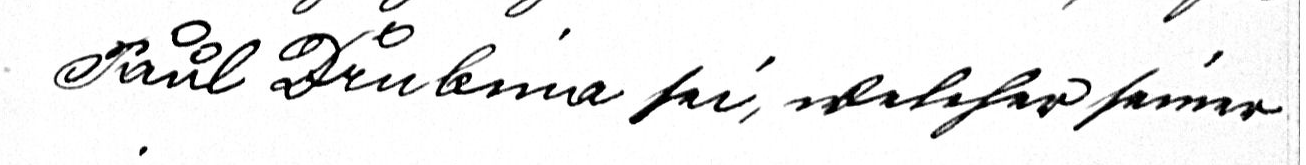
Paul Drubina sei, welcher seiner
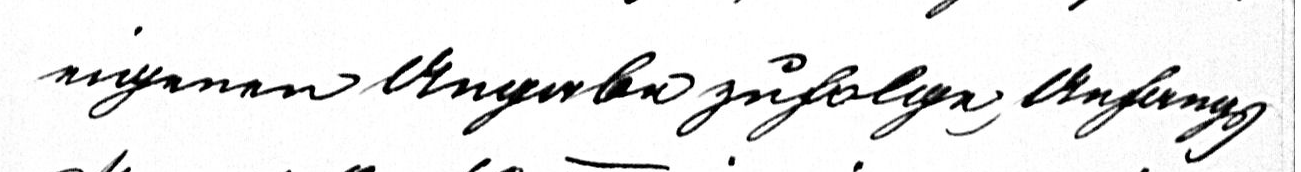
eigenen Angabe zufolge, Anfangs
